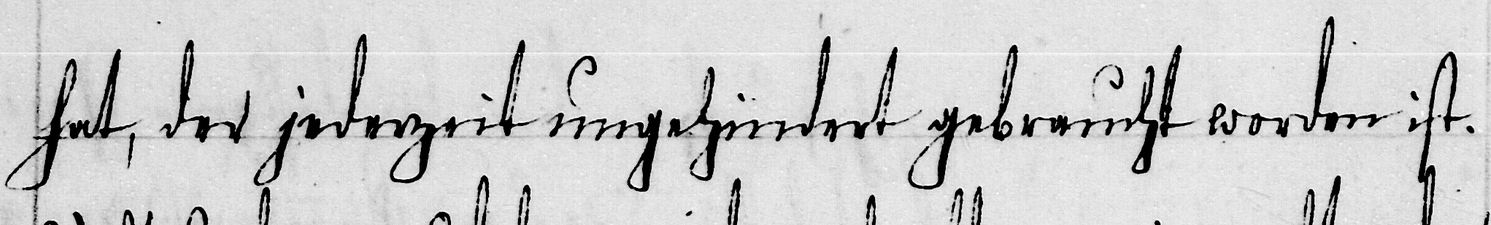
hat, der jederzeit ungehindert gebraucht worden ist.
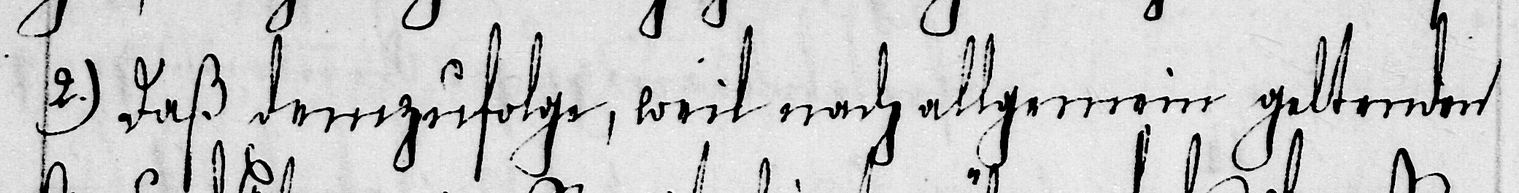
2.) Daß demzufolge, weil nach allgemein geltenden
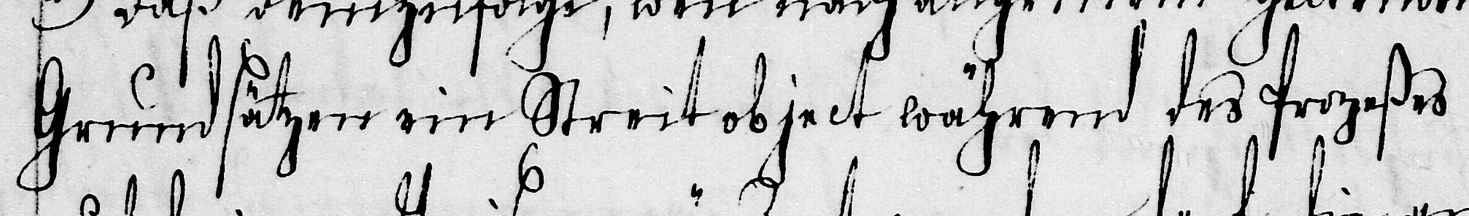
Grundsätzen ein Streitobject während des Prozeßes
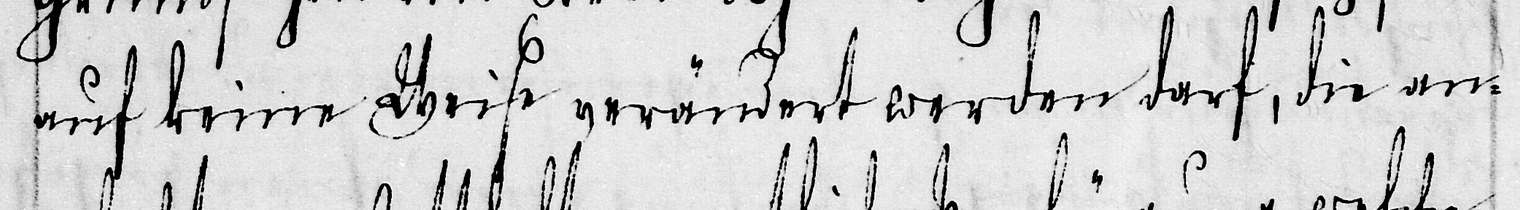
auf keine Weise verändert werden darf, die an¬
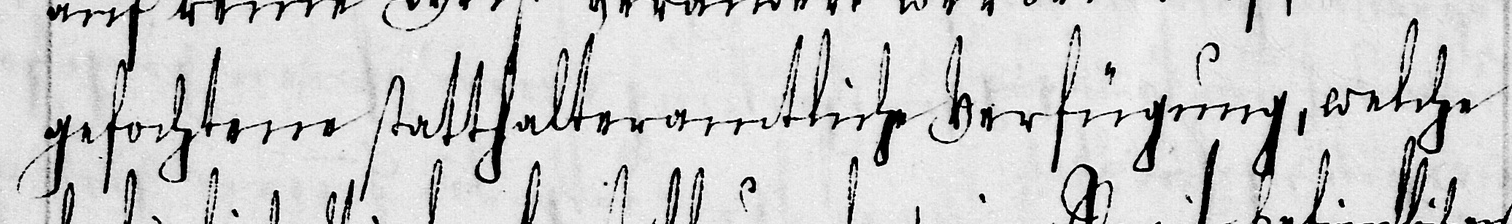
gefochtene statthalteramtliche Verfügung, welche
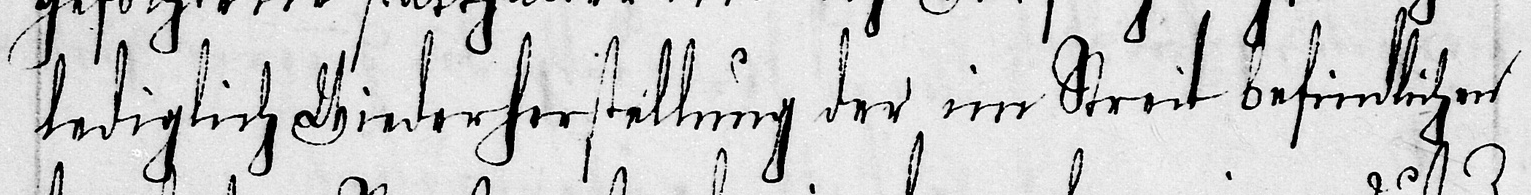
lediglich Wiederherstellung der im Streit befindlichen
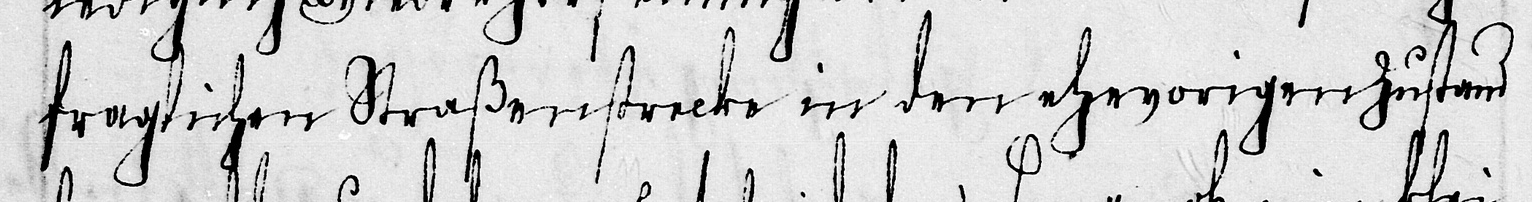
fraglichen Straßenstrecke in den ehevorigen Zustand
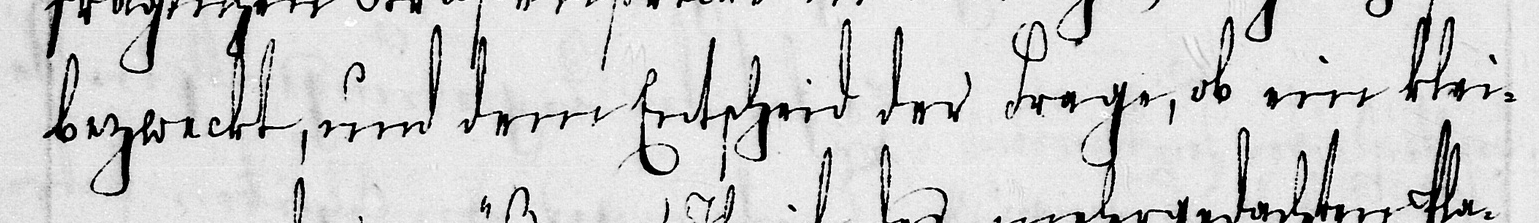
bezweckt, und dem Entscheid der Frage, ob ein klei¬
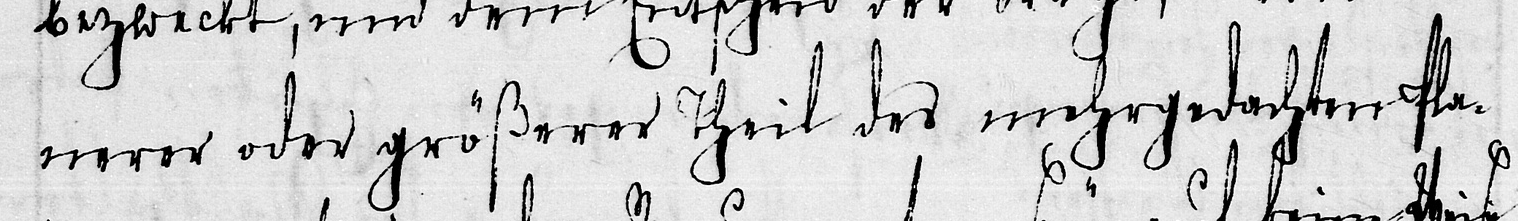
nerer oder größerer Theil des mehrgedachten Pla¬
